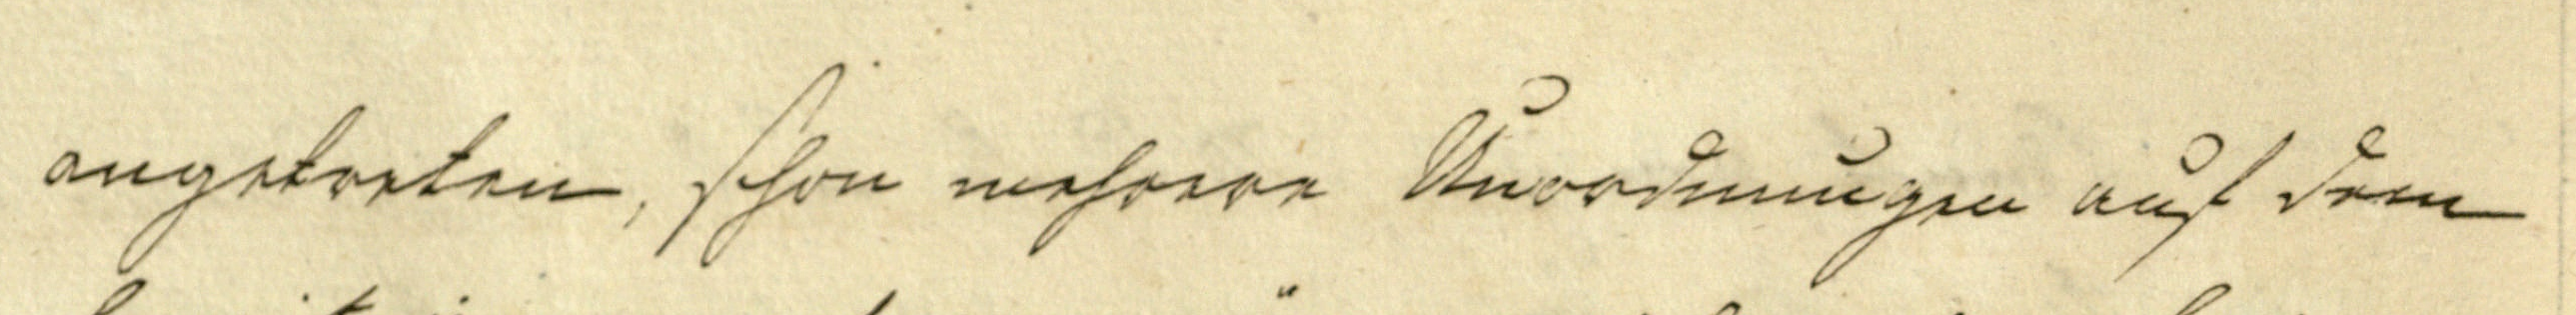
angetreten, schon mehrere Unordnungen auf dem
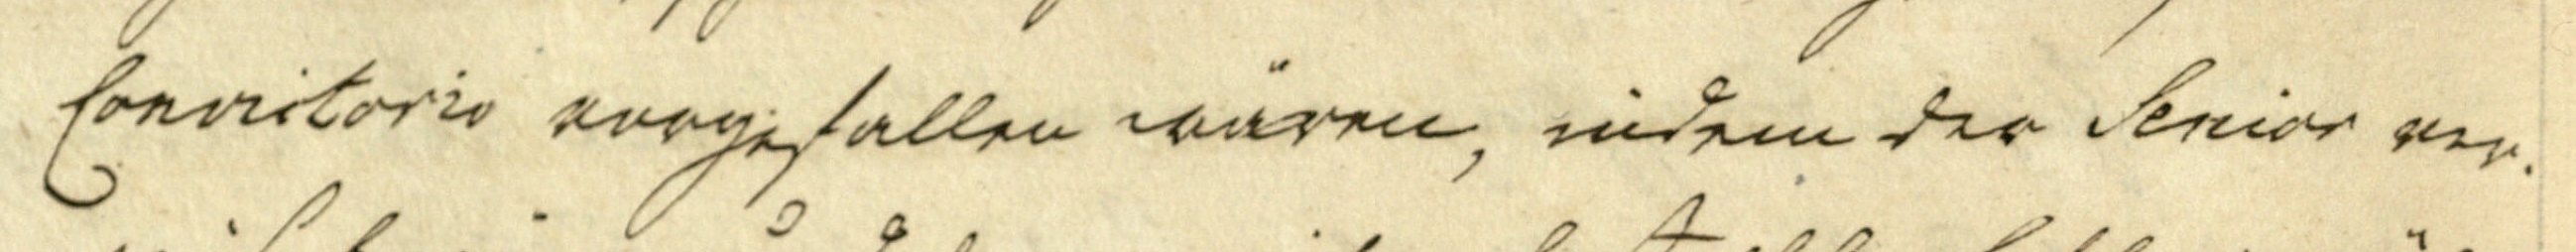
Convictorio vorgefallen wären, indem der Senior ver¬
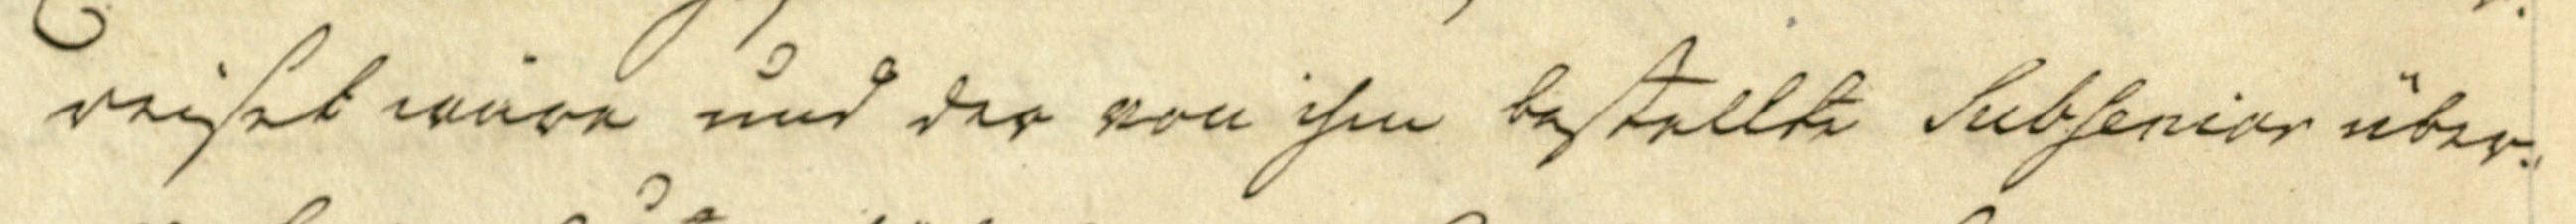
reiset wäre und der von ihm bestellte Subsenior über¬
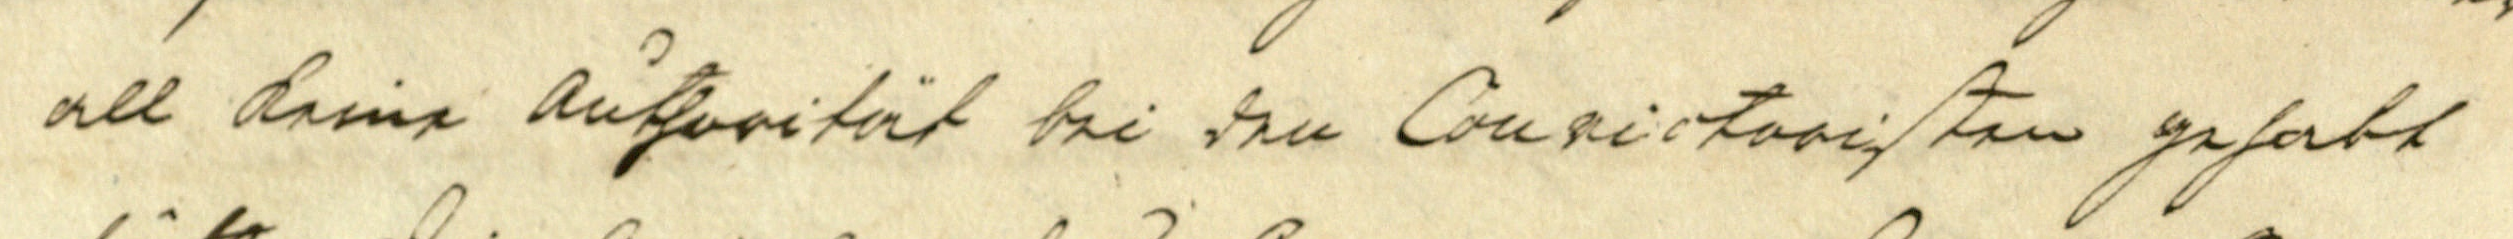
all keine Authorität bei den Convictoristen gehabt
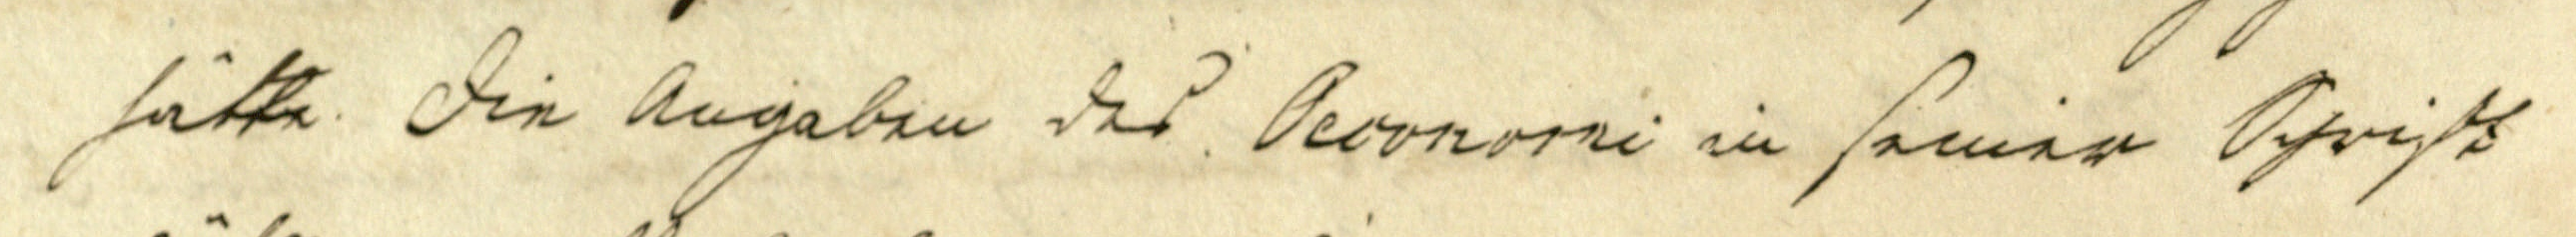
hätte. Die Angaben des Oecomomi in seiner Schrift
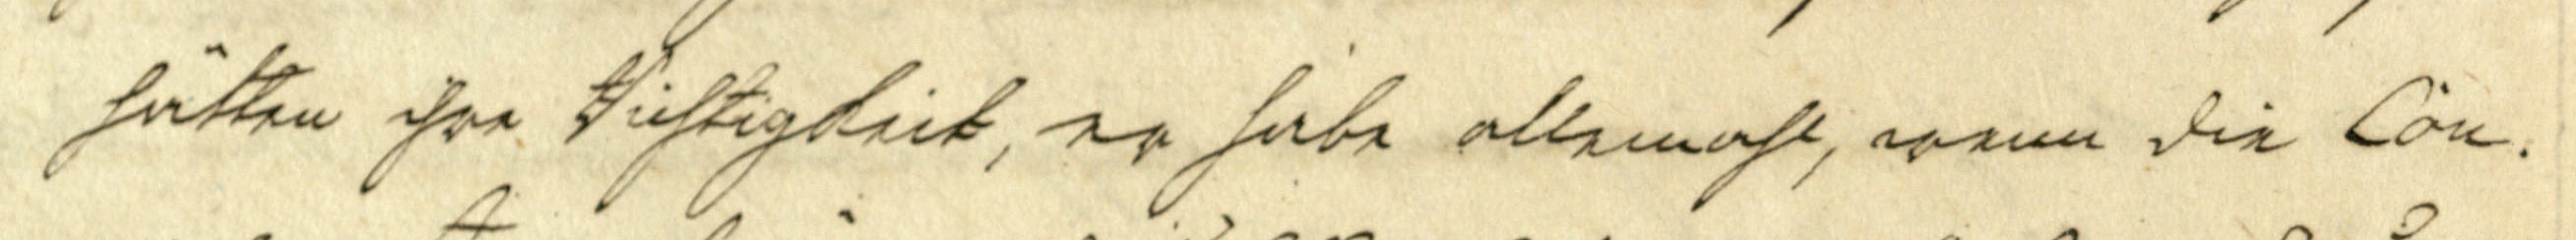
hätten ihre Richtigkeit, er habe allemahl, wenn die Con¬
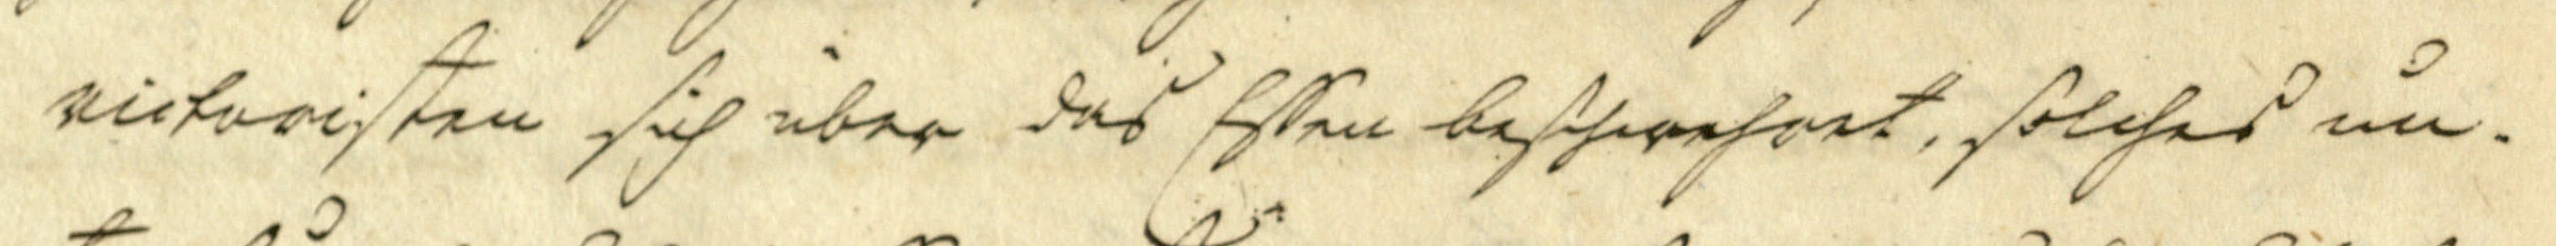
vitoristen sich über das Essen beschwehret, solches un¬
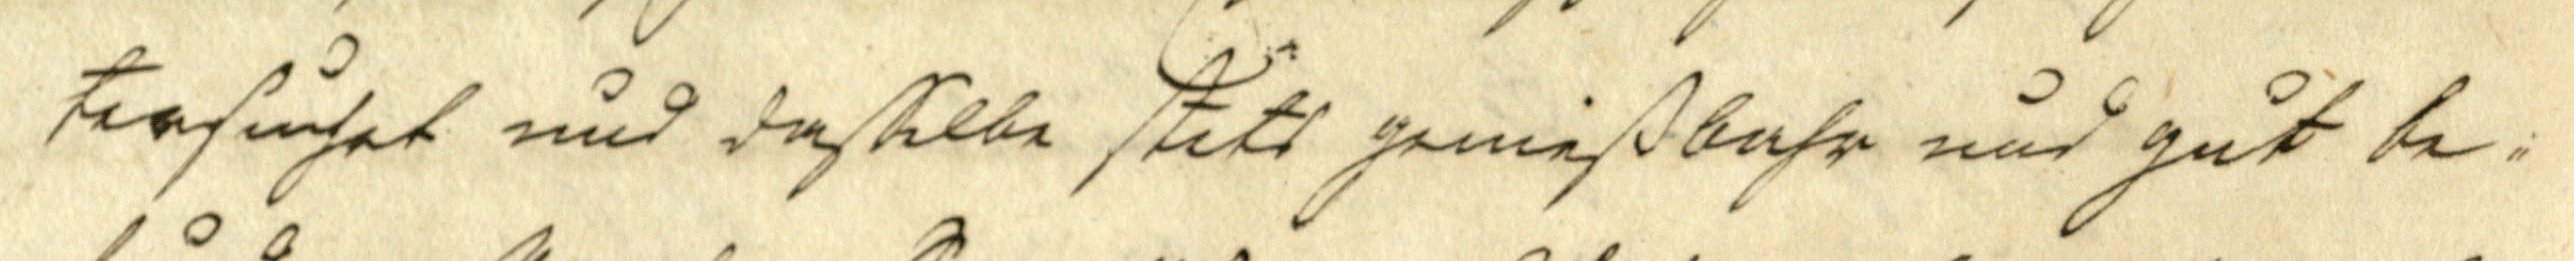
tersuchet und dasselbe stets genießbahr und gut be¬
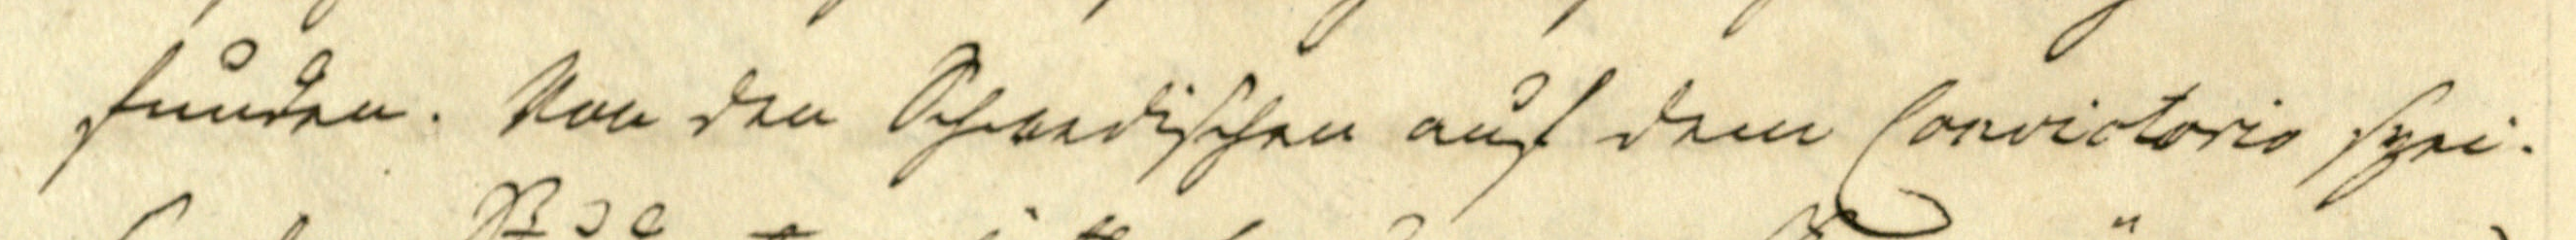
funden. Von den Schwedischen auf dem Convictorio spei¬
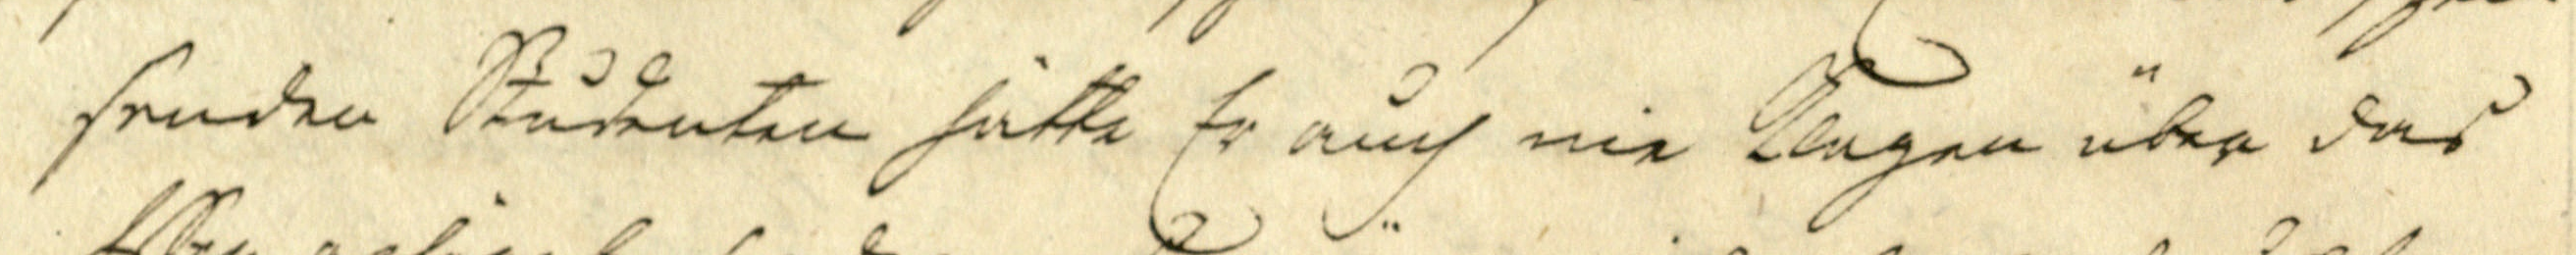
senden Studenten hätte Er auch nie Klagen über das
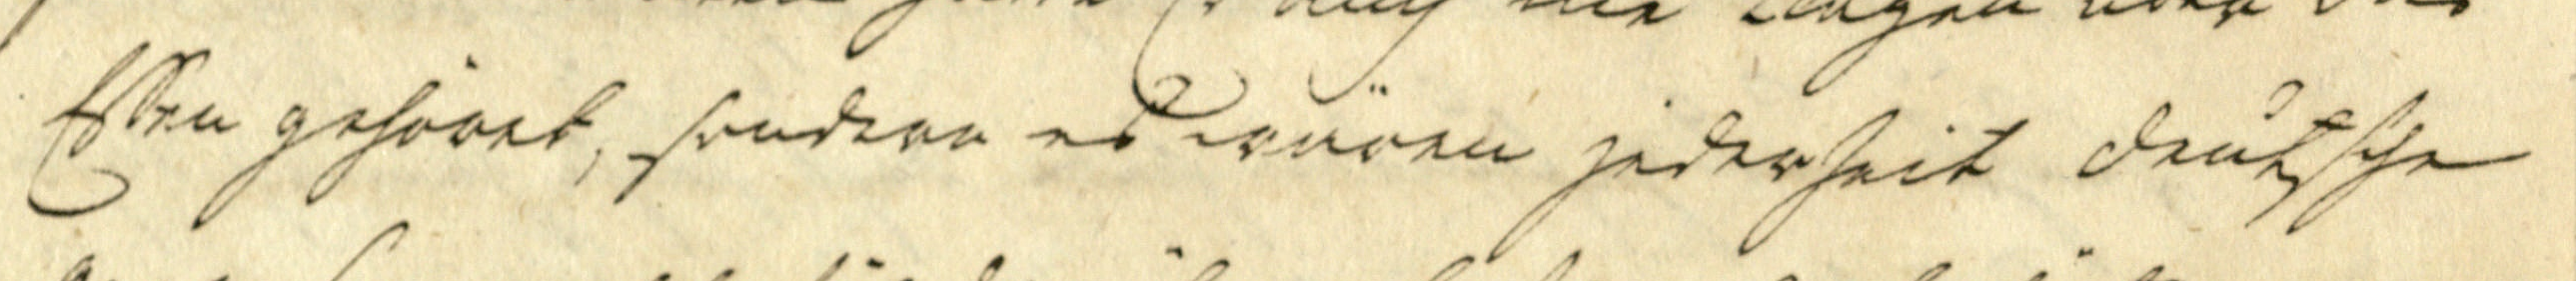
Essen gehöret, sondern es wären jederzeit deutsche
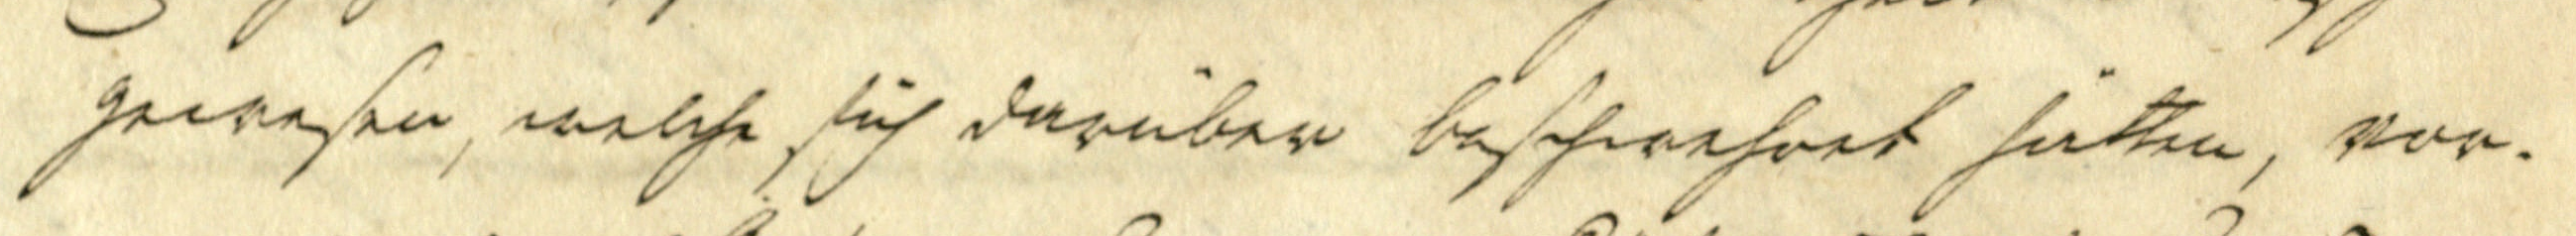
gewesen, welche sich darüber beschwehret hätten, vor¬
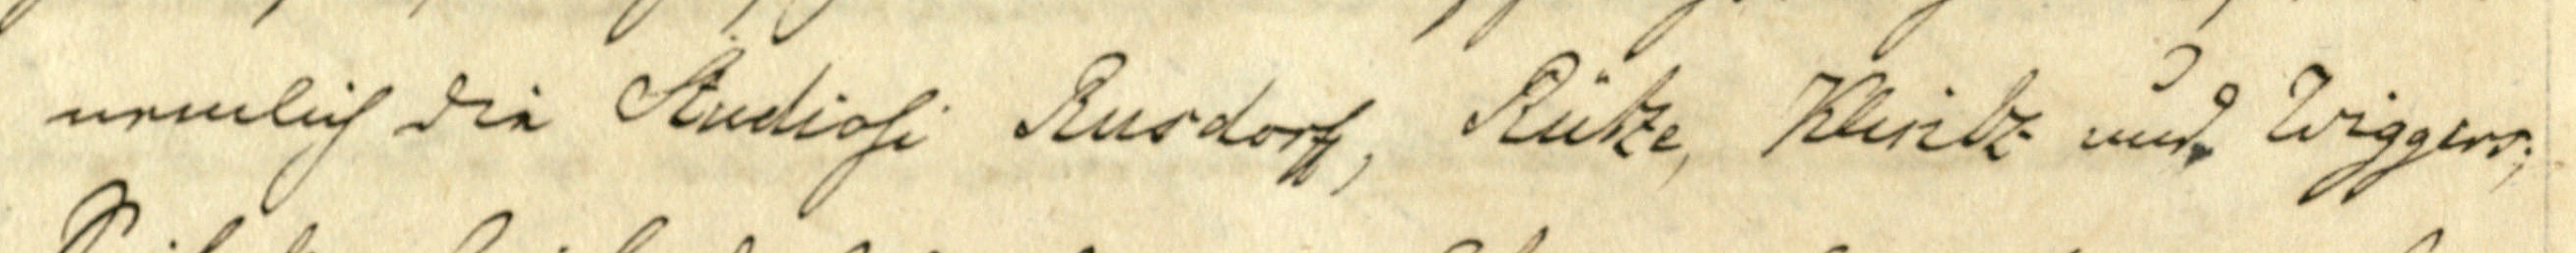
nemlich die Studiosi Rusdorff, Rütze, Klintz und Wiggers;
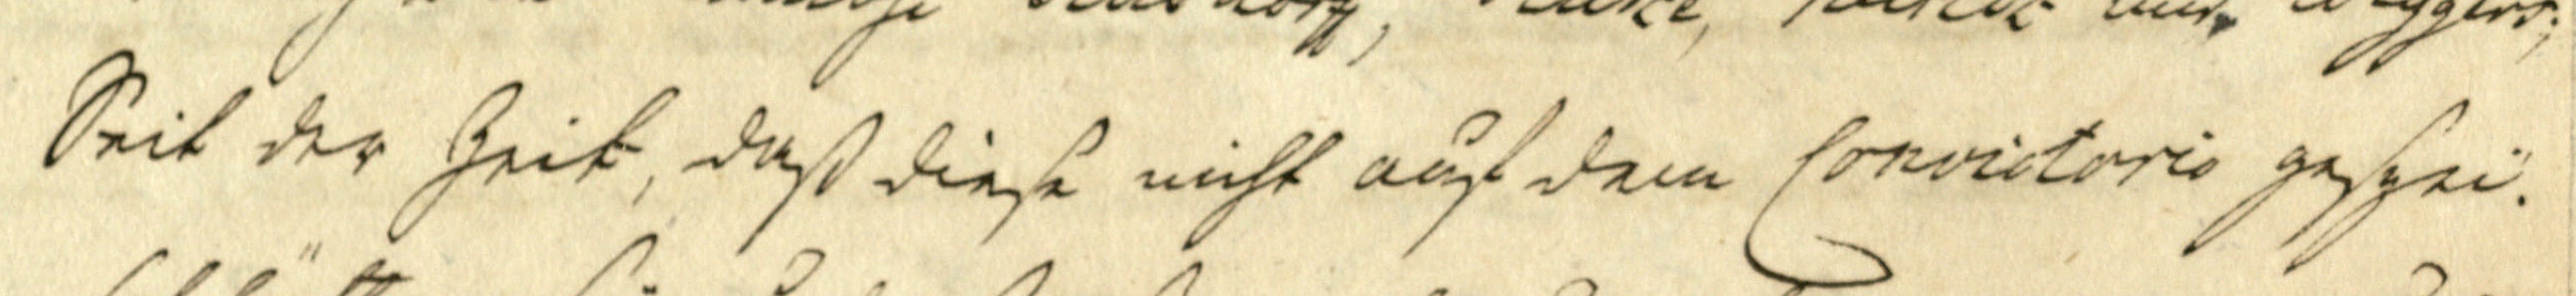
Seit der Zeit, daß diese nicht auf dem Convictorio gespei¬
